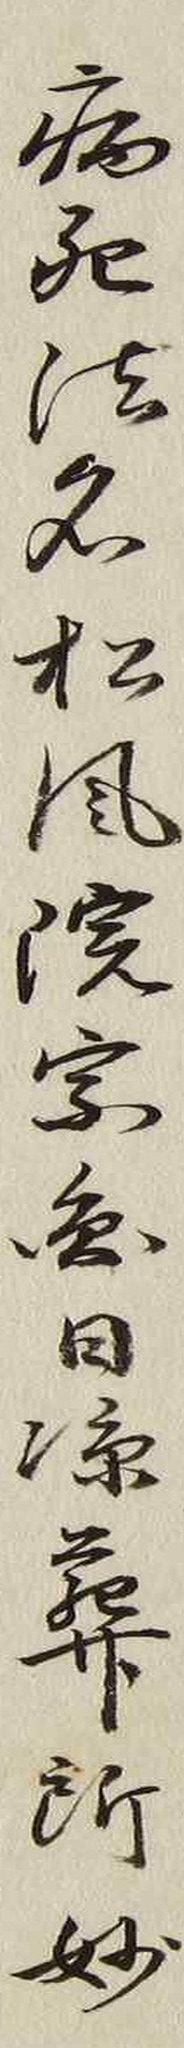病死法名松風院宗円日涼葬所妙
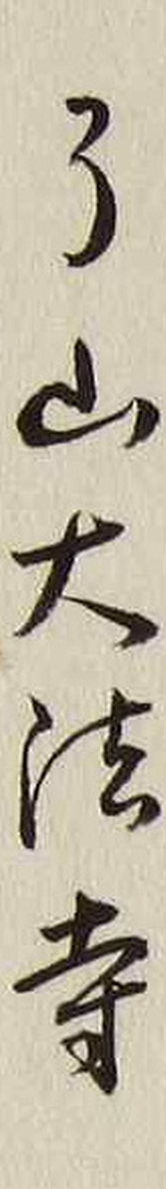了山大法寺

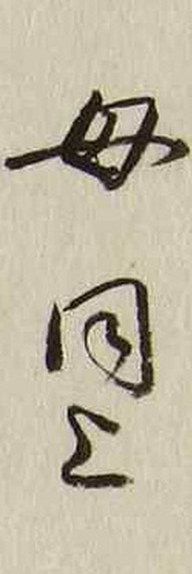母同上
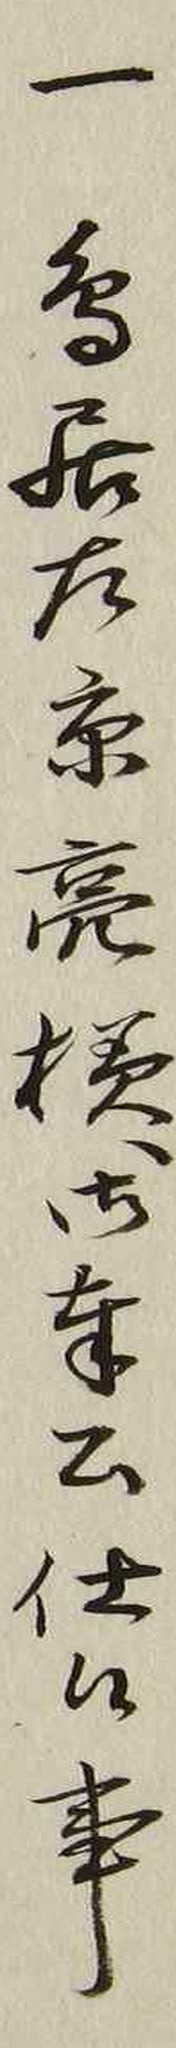一鳥居左京亮様へ御奉公仕候事
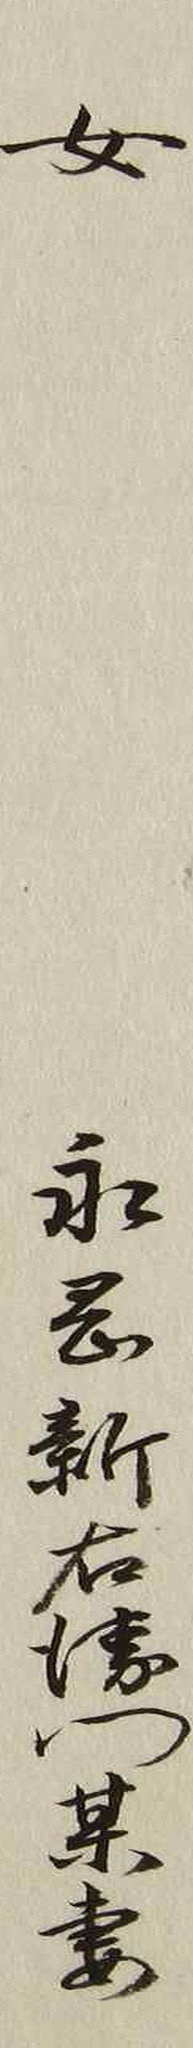女永岡新右衛門某妻
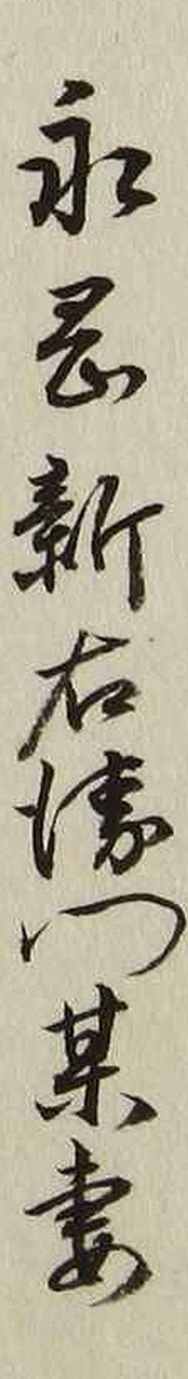女永岡新右衛門某妻
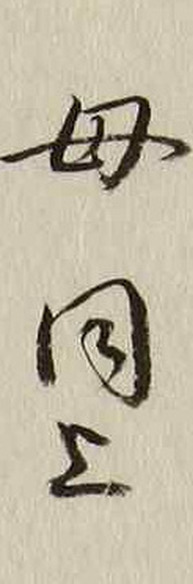母同上
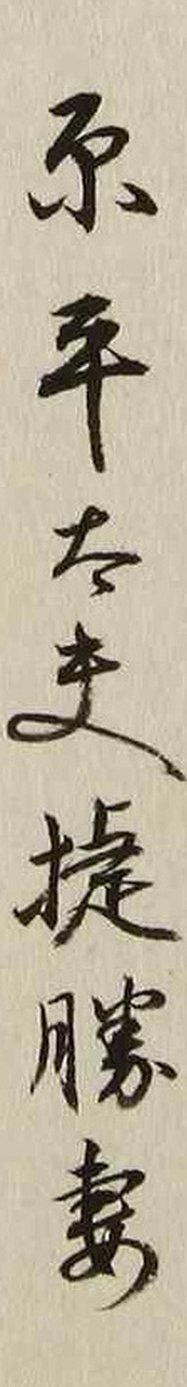原平太夫捷勝妻
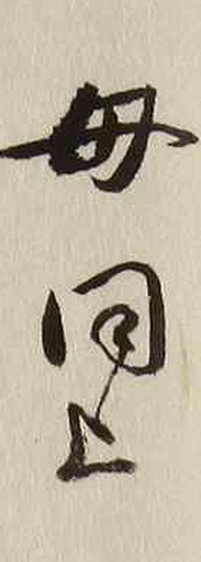母同上
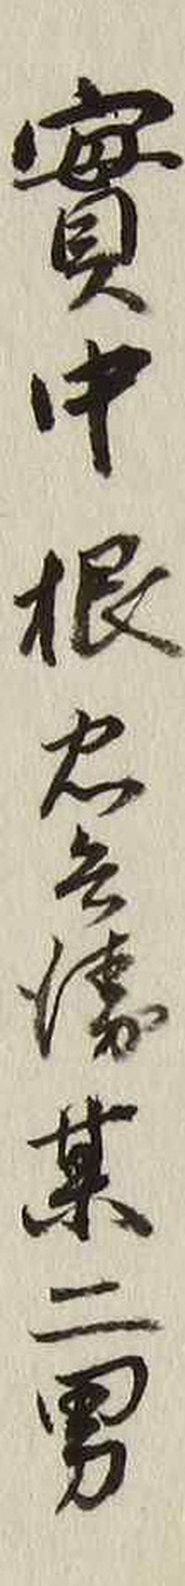実中根忠兵衛某二男
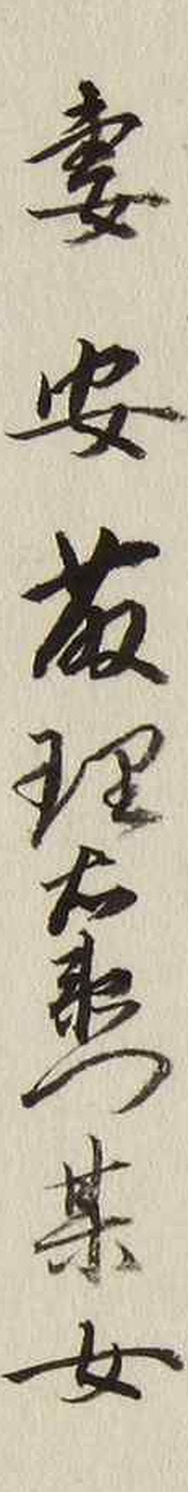妻安藤理右衛門某女
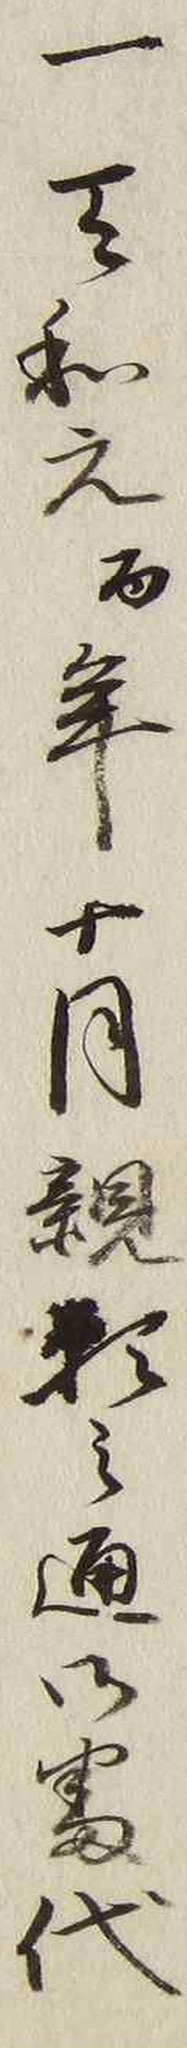一天和元酉年十月親願之通御番代

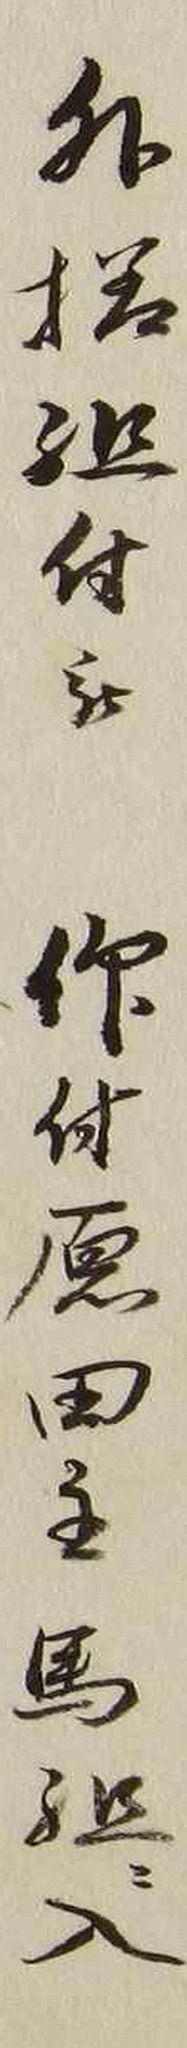外様組附被仰付原田主馬組ニ入
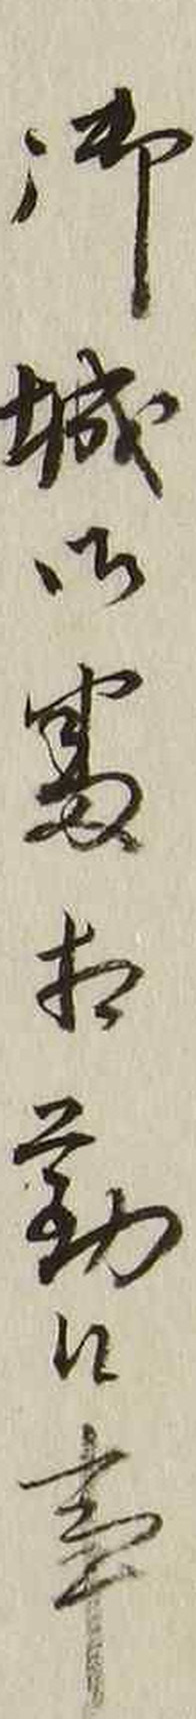御城御番相勤候事
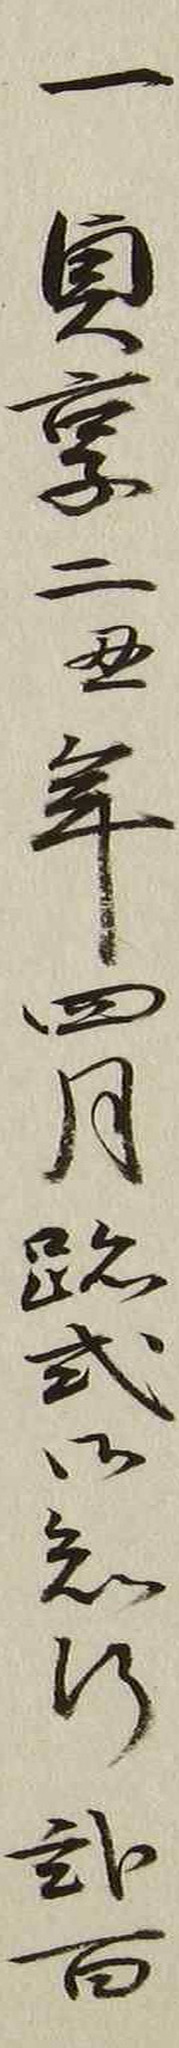一貞享二丑年四月跡式御知行弐百
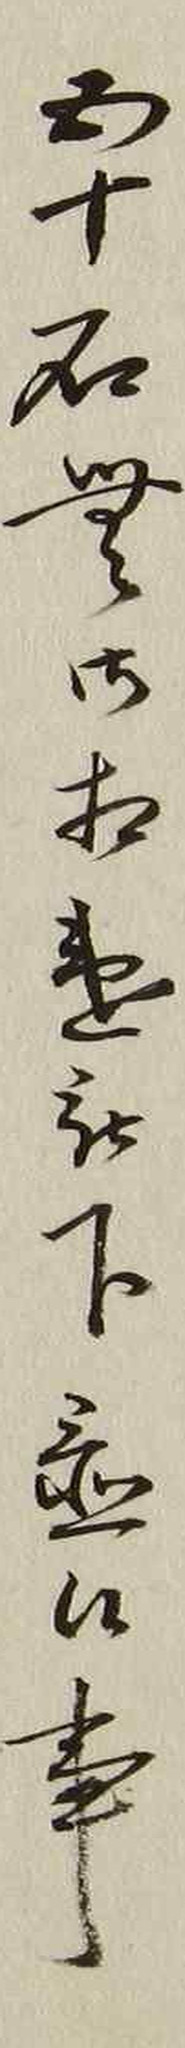五十石無御相違被下置候事
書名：諸士系譜　巻之160　な之部2
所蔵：会津若松市立会津図書館
